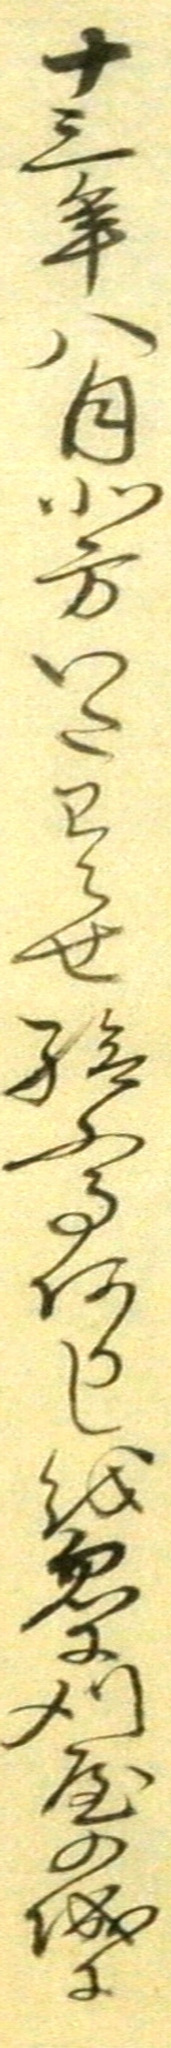十三年八月北方いたわらせ給ふ事ありしを急に刈屋の城に
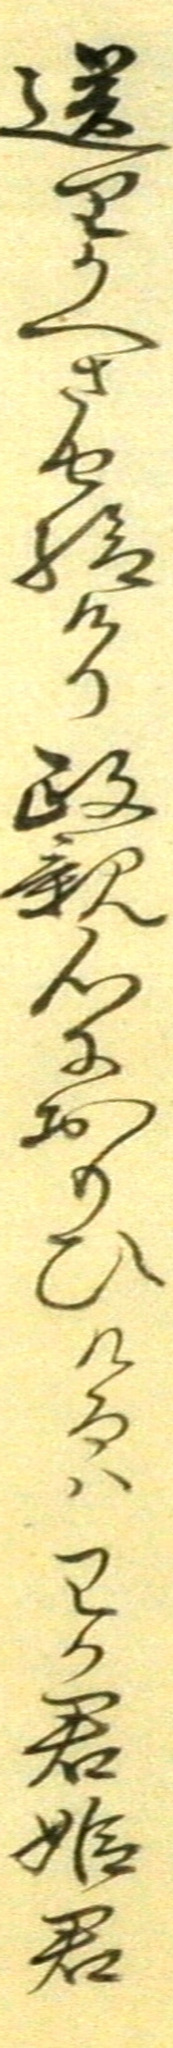送りかへさせ給けり政親心におもひけるはわか君姫君
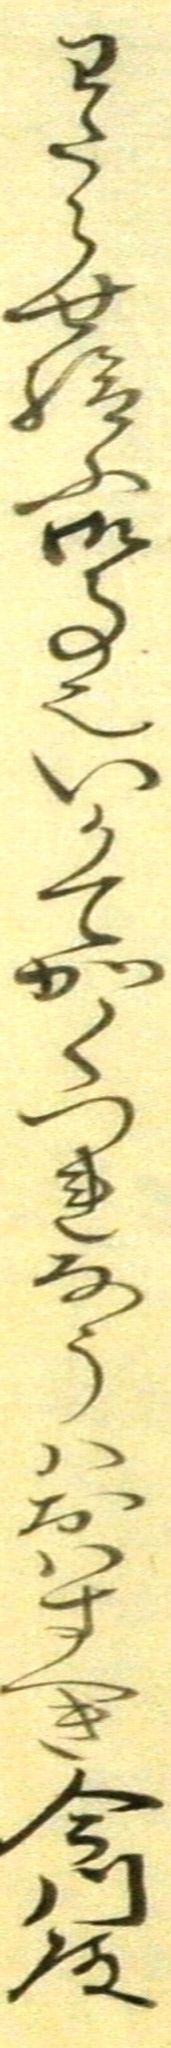わたらせ給ふ御事也いかてかくつれなうはおはすへき今川殿
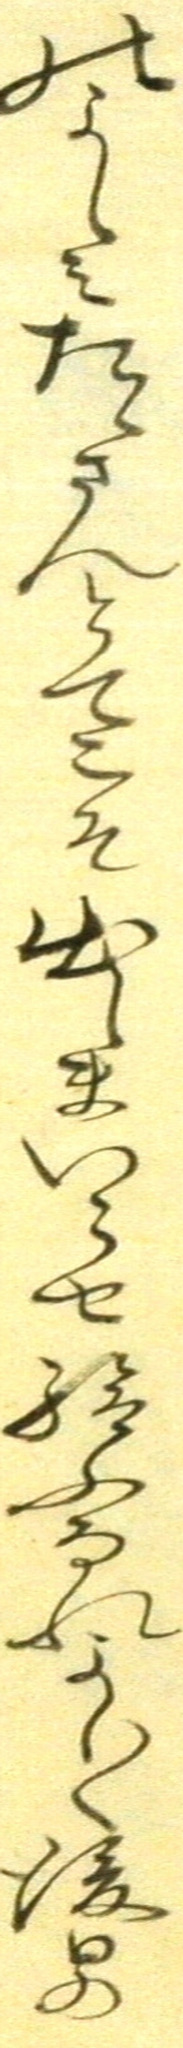のよしみたゝさんとてこそ出しまいらせ給ふなれよし〳〵後日の
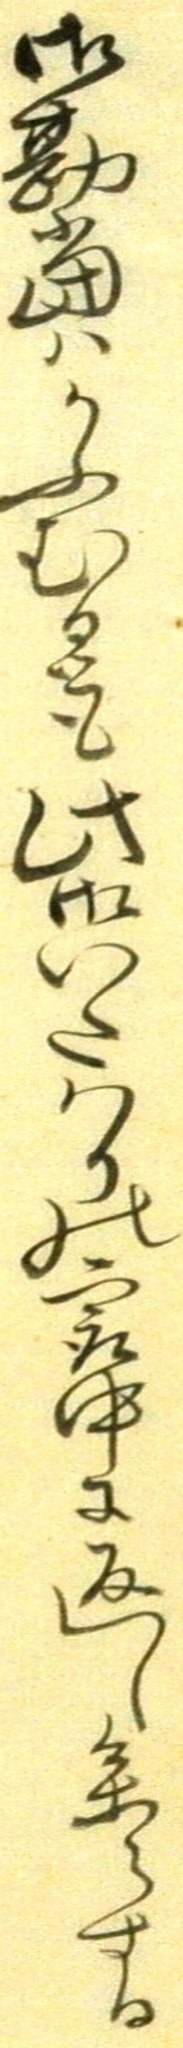御勘当はかふむるとも此御いたわりの最中に返し参らする
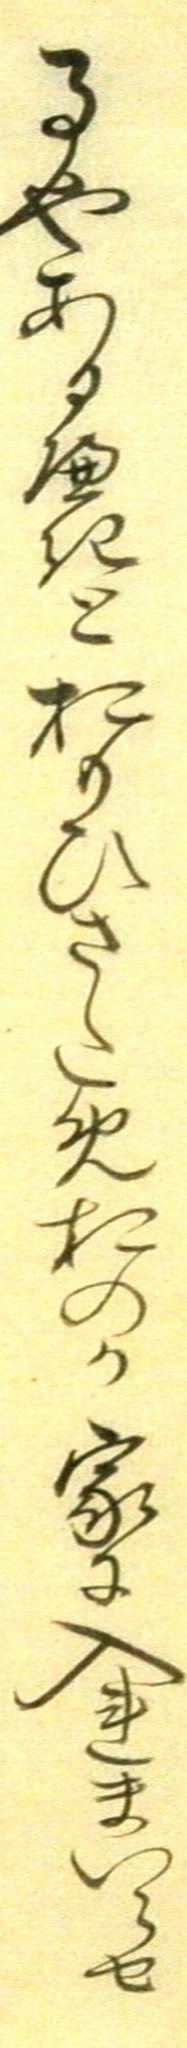事やあるへきとおもひさためおのか家に入れまいらせ
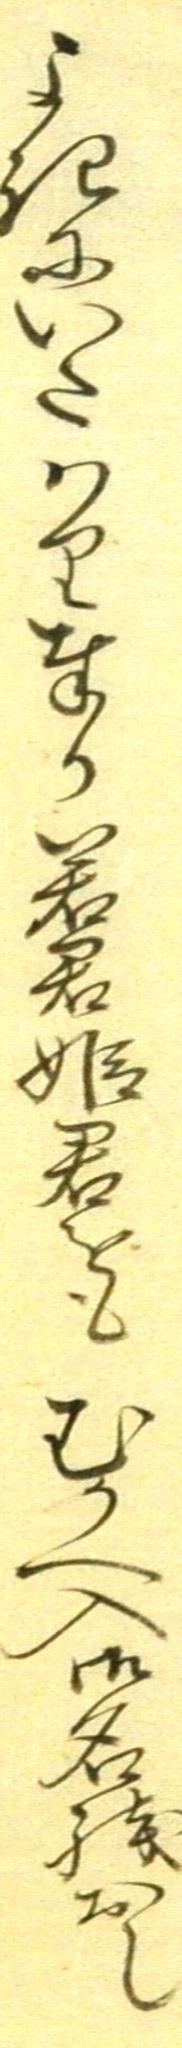よきにいたわり奉り若君姫君をもむかへ入御名残おし
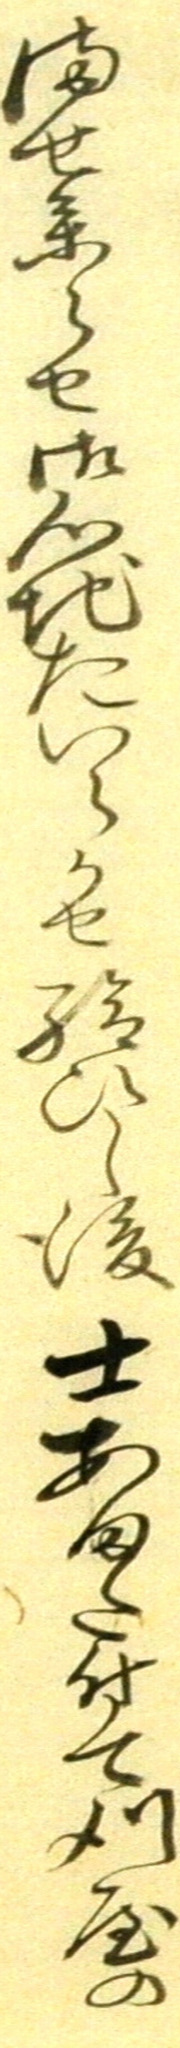ませ参らせ御心地たいらかせ給ひし後士あまた付て刈屋の
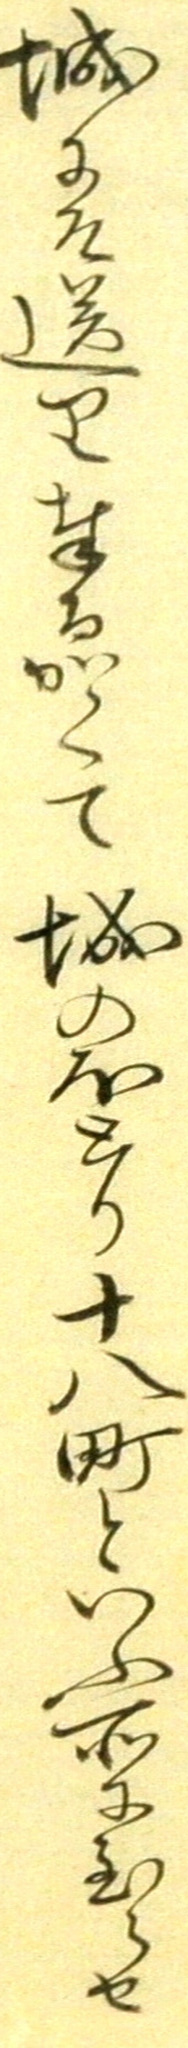城にそ送り奉るかくて城のほとり十八町といふ所に至らせ
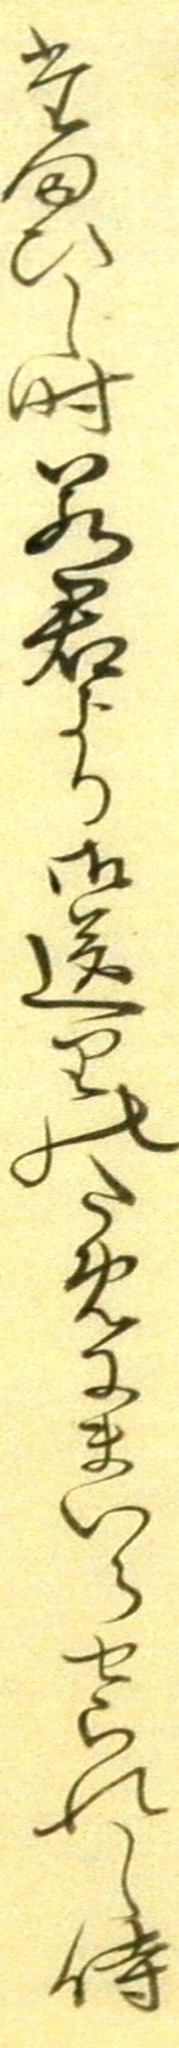たまひし時若君より御送りのためにまいらせられし侍
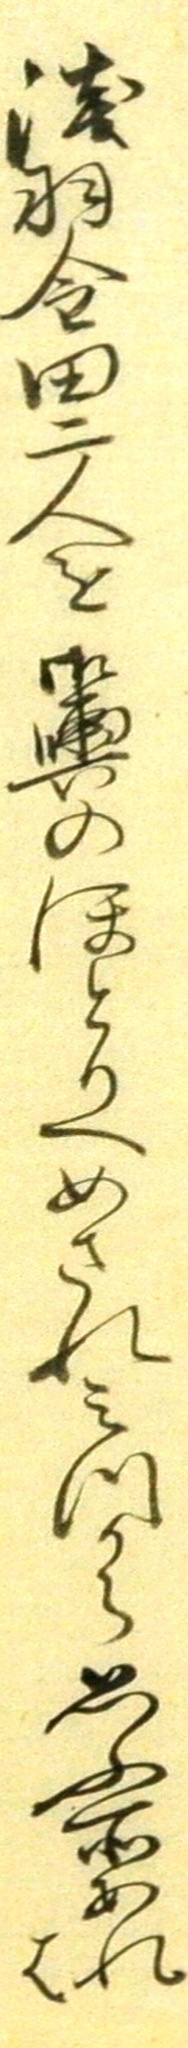浅羽金田二人を御輿のほとりへめされみつから思ふ所あれは
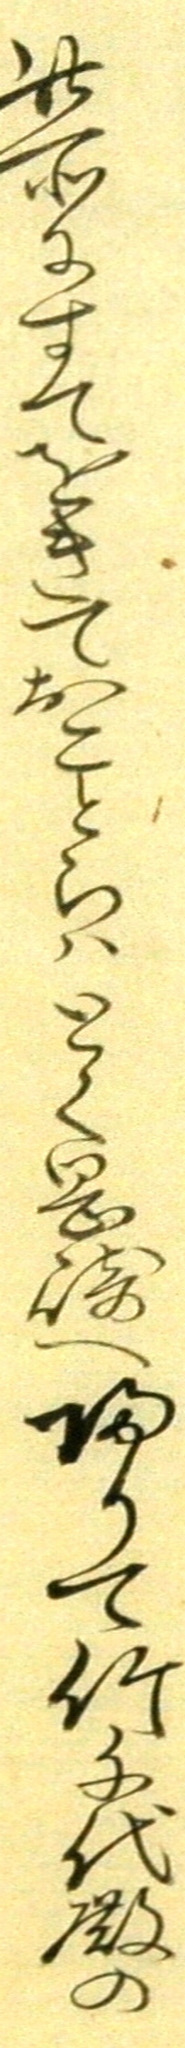此所にすてをきておことらはとく岡崎へ帰りて竹千代殿の
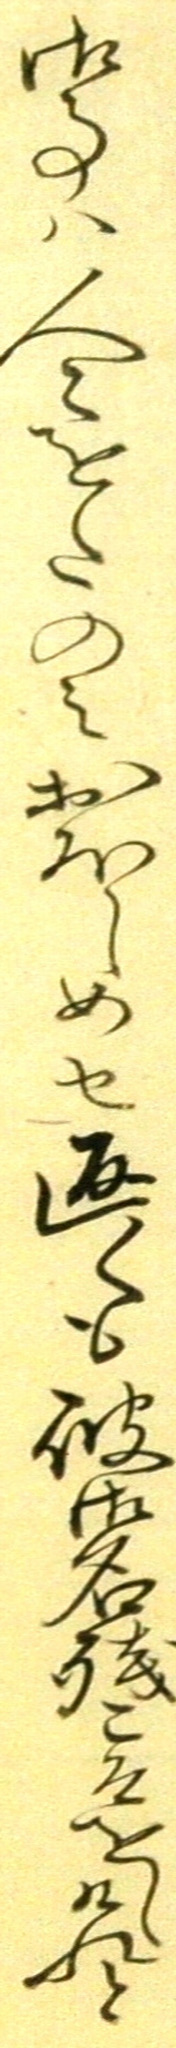御事は人々をたのみおほしめせ返〳〵も彼御名残こそをしけれと
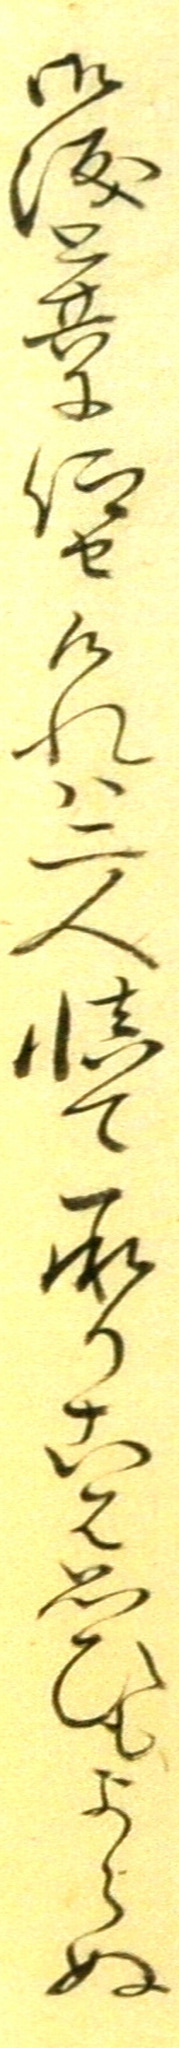御涙と共に仰せけれは二人慎て承りこは思ひもよらぬ

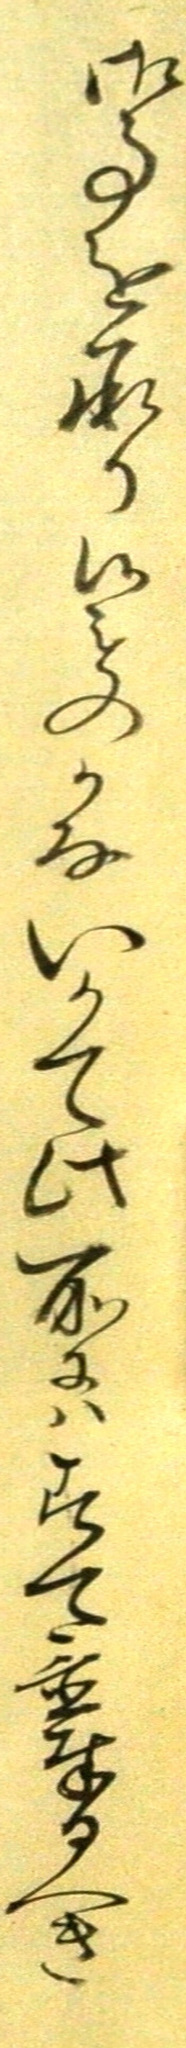御事を承り候ものかないかて此所にはすて置奉るへき
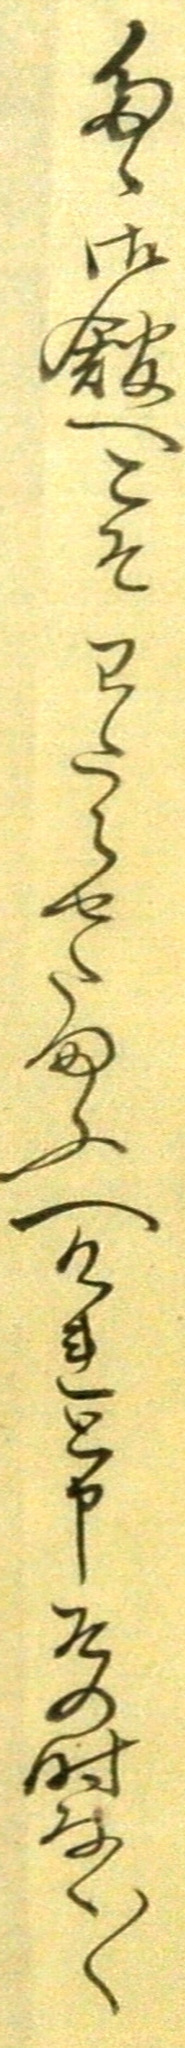たゝ御館へこそわたらせたまふへけれと申その時なく〳〵
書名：藩翰譜（五）
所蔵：伊那市立高遠町図書館・合同会社AMANE
